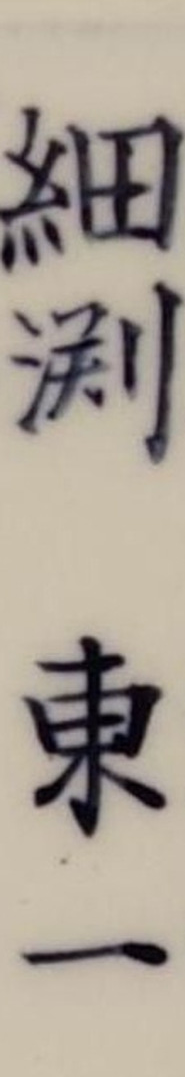細渕東一
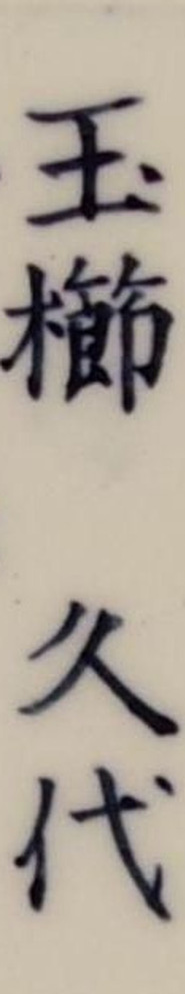玉櫛久代
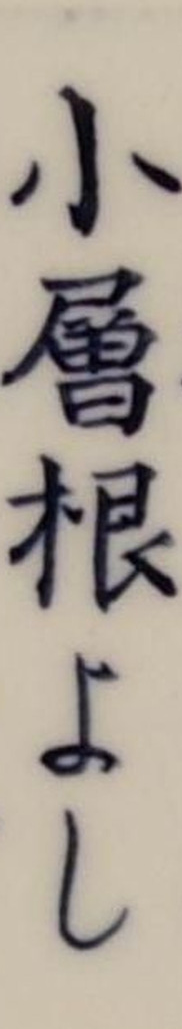小層根よし
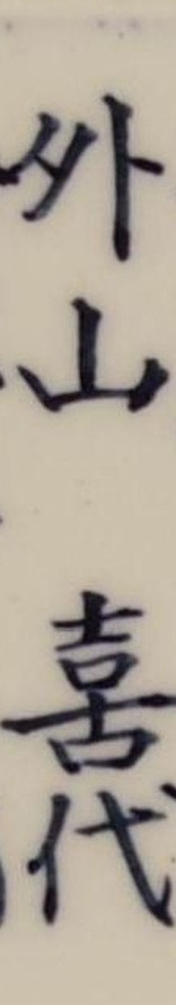外山喜代
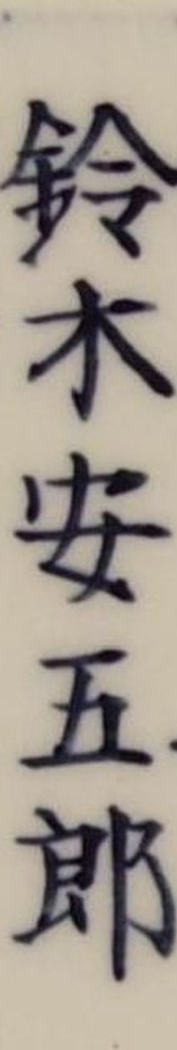鈴木安五郎
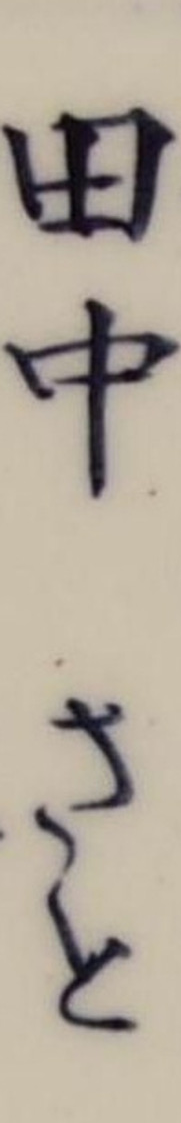田中さと
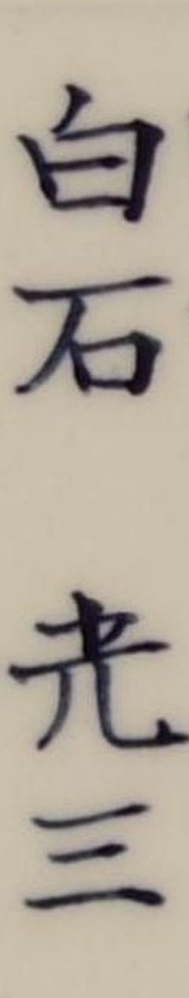白石光三
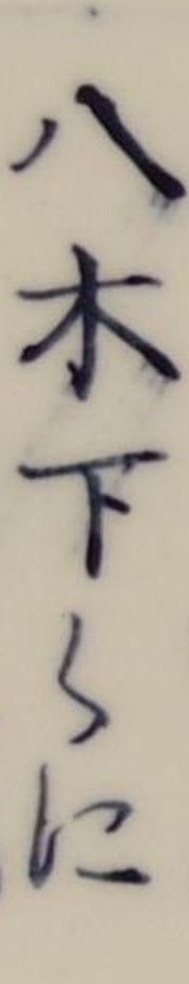八木下くに
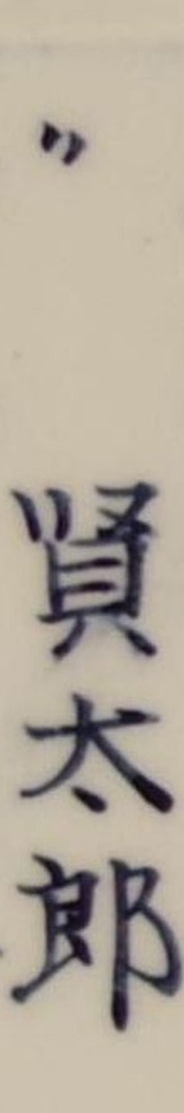賢太郎
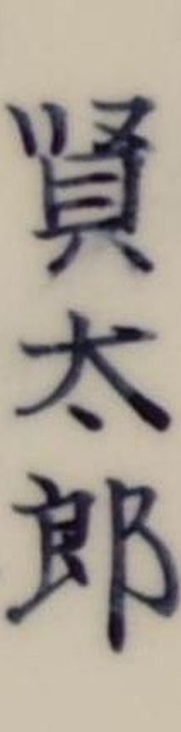賢太郎
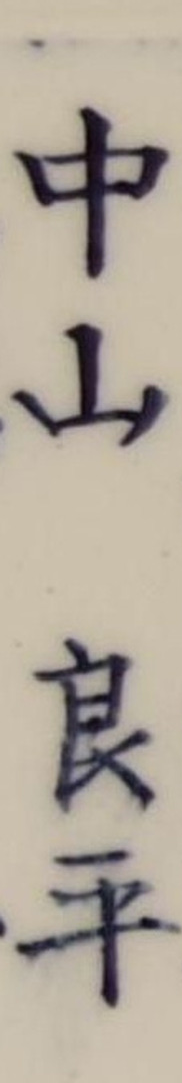中山良平
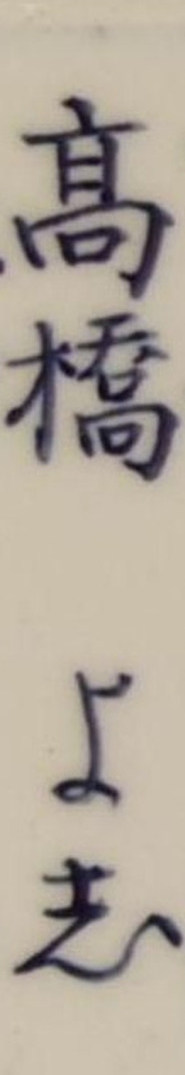高橋よし
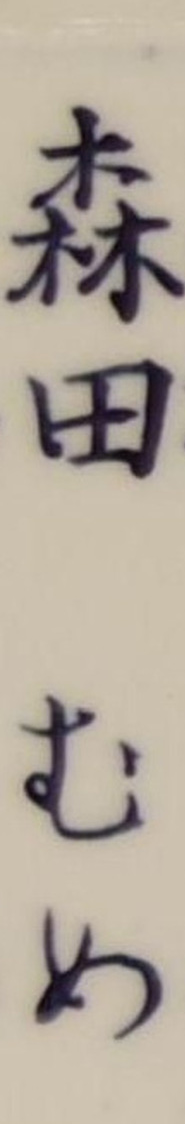森田むめ
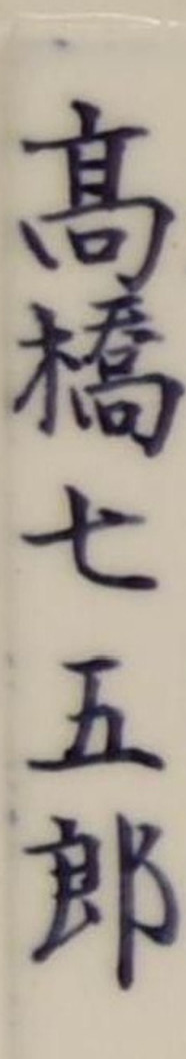高橋七五郎

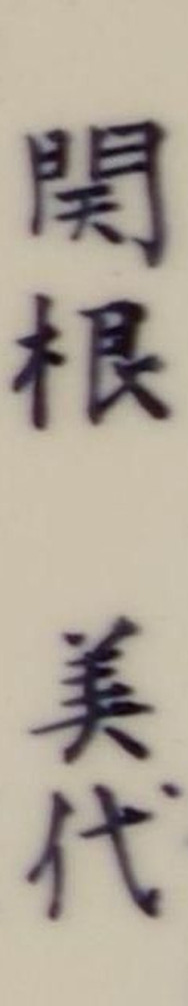開根美代
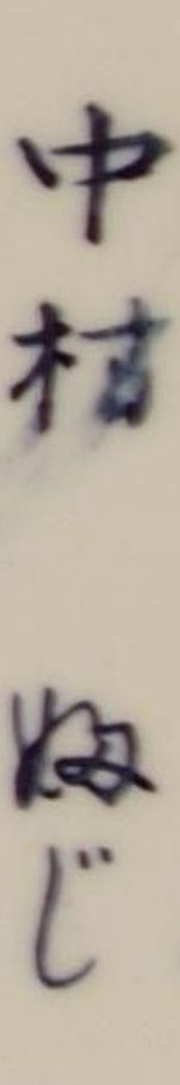中村ふじ
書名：E~L
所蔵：高野山金剛峯寺
